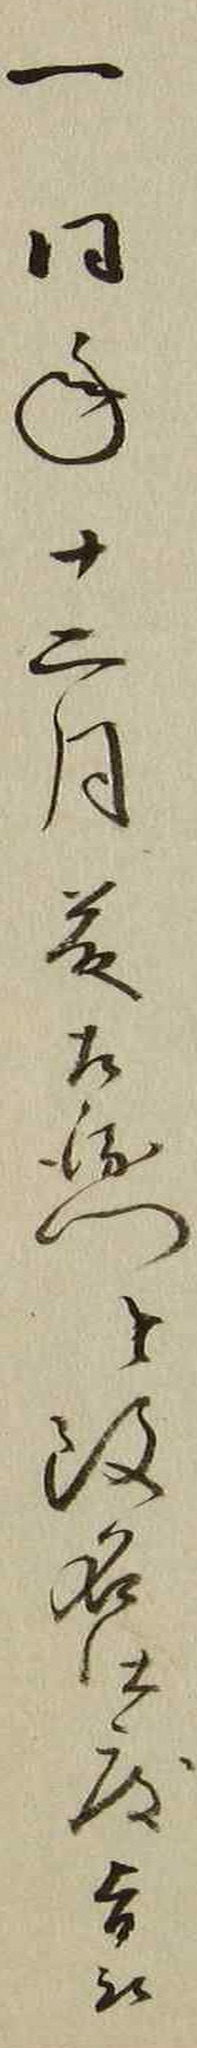一同年十二月藤左衛門と改名仕度旨被
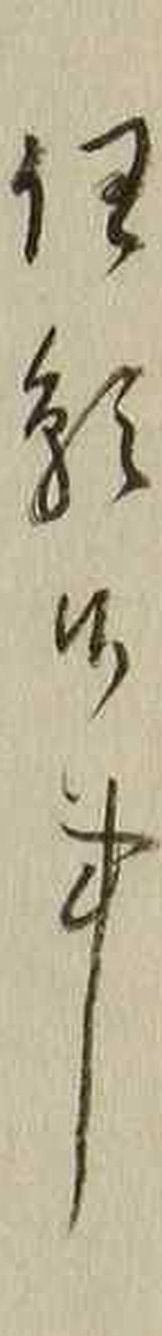任願候事
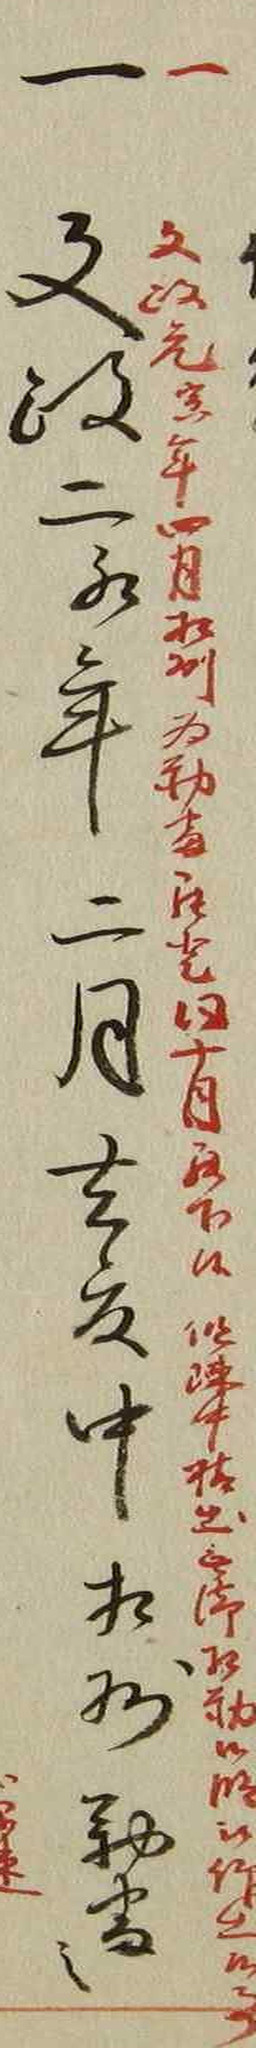一文政二卯年二月去夏中相州勤番之
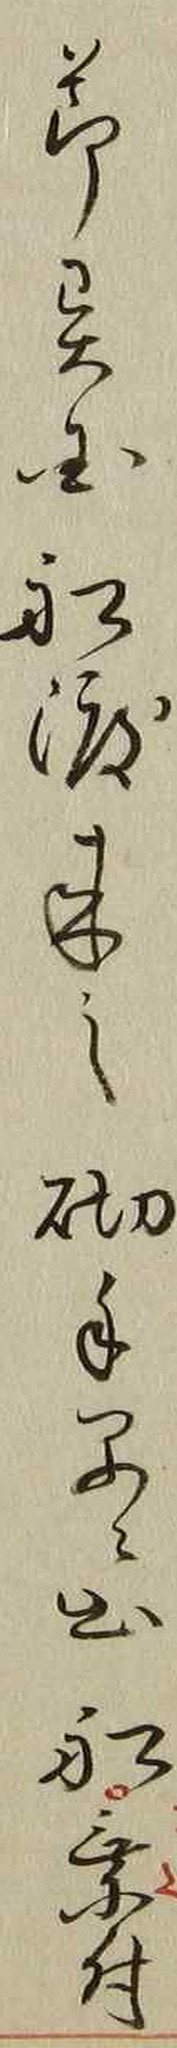節異国船渡来之砌手早に出船乗付
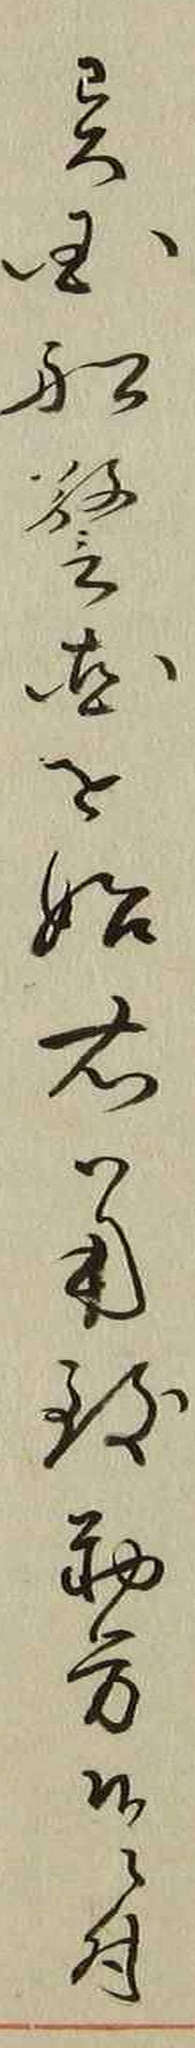異国船警固を始右御用致勤労候に付
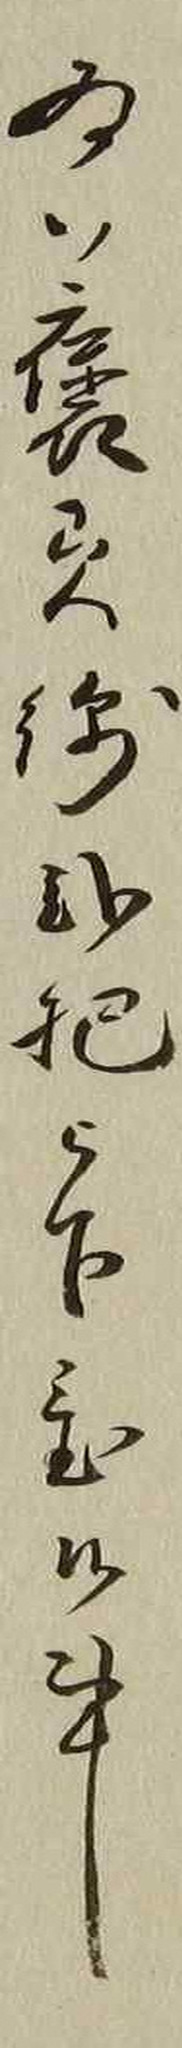為御褒美綿二把被下置候事
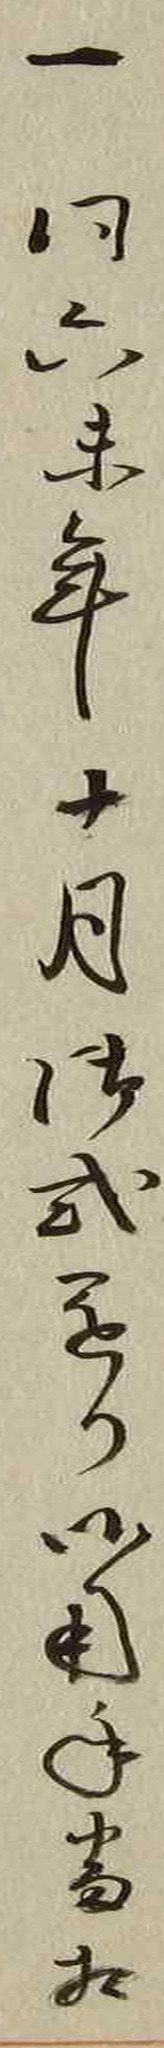一同六未年十月御式懸り御用年番相
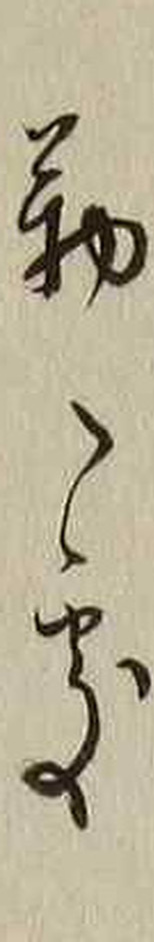勤候処
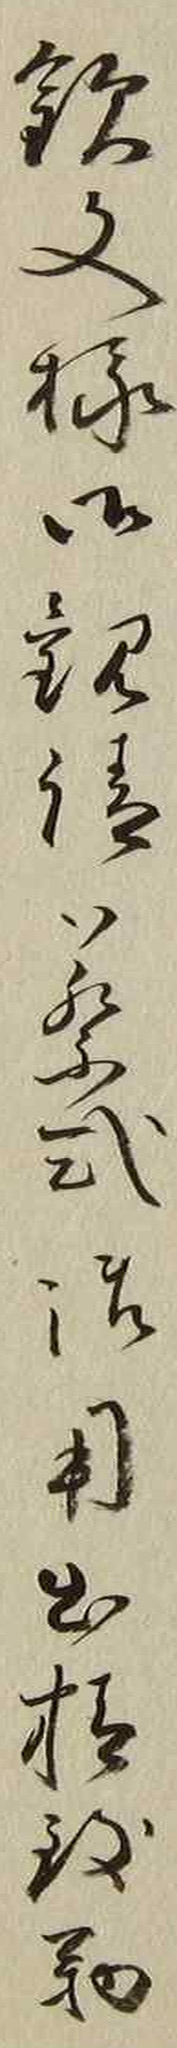欽文様御観請御祭式御用出精致勤
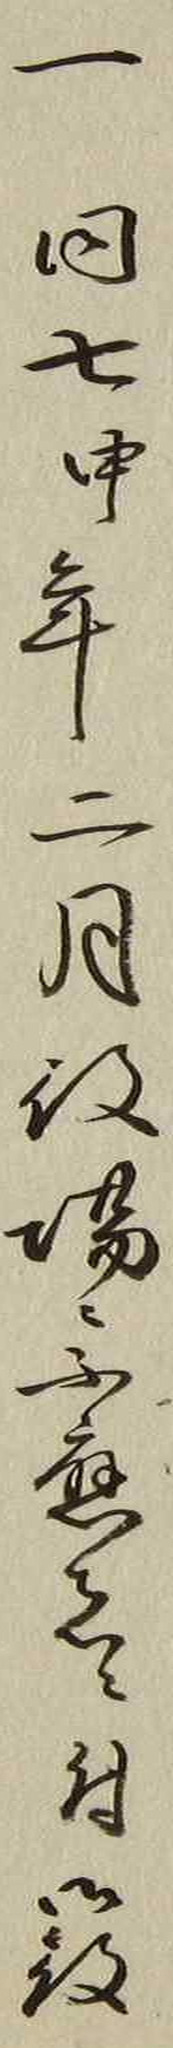一同七申年二月役場に不応者に付御役
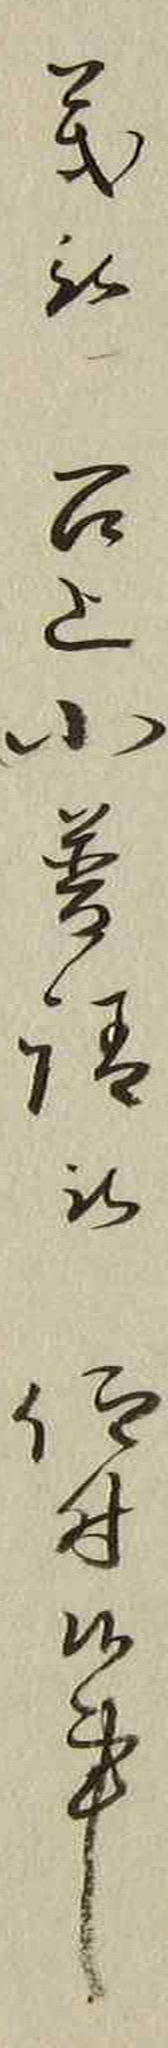義被召上小普請被仰付候事

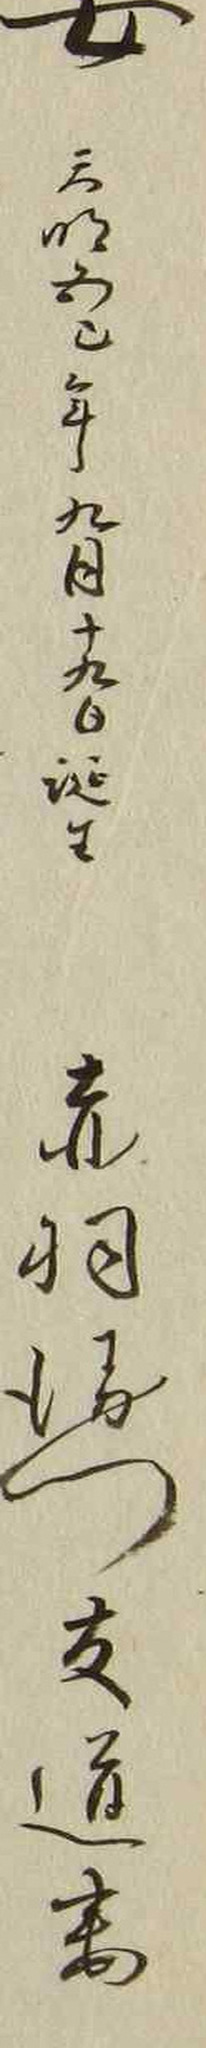女天明五巳年九月十九日誕生赤羽衛門友道妻
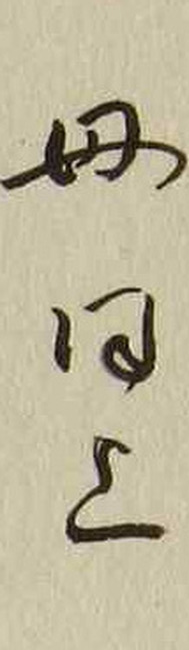母同上
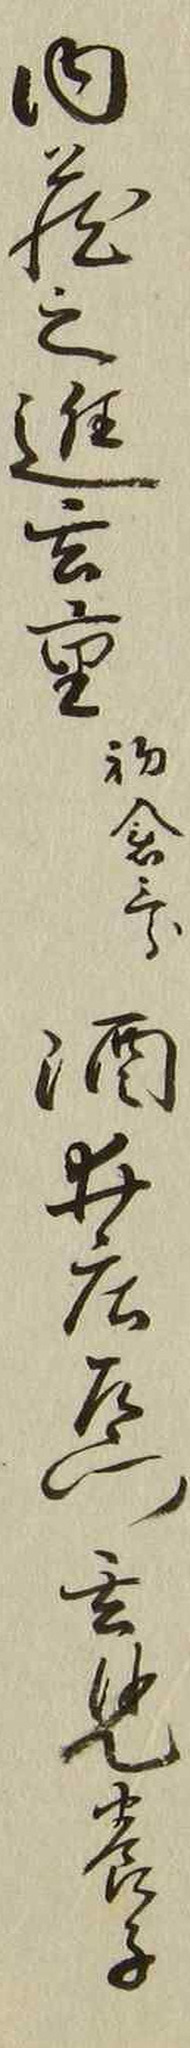内蔵之進玄重初倉三郎酒井庄左衛門玄見養子
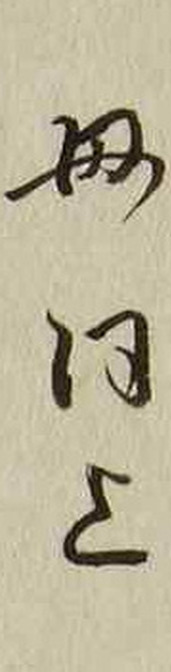母同上
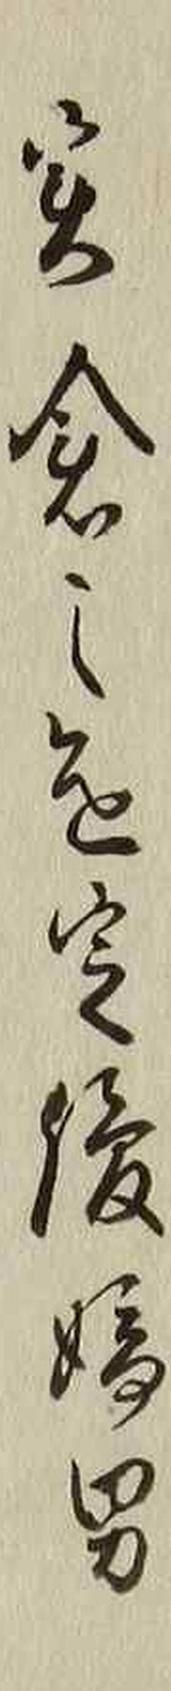実倉之進定俊嫡男
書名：諸士系譜　巻之3　い之部3
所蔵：会津若松市立会津図書館
